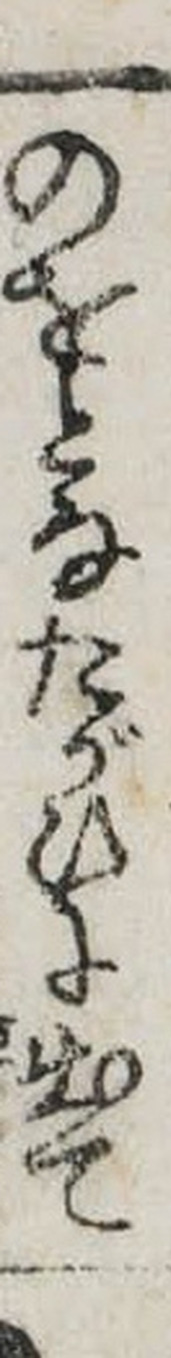のをとなたがひに出て
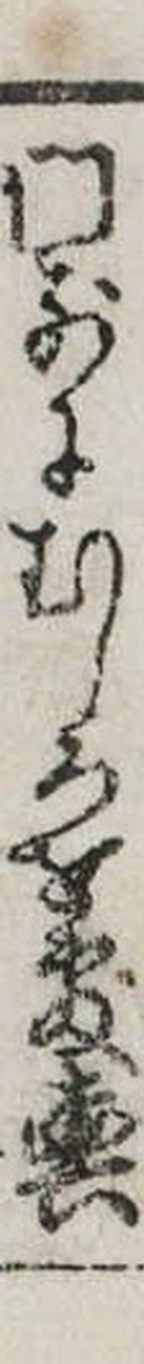門前にむしろを敷輿
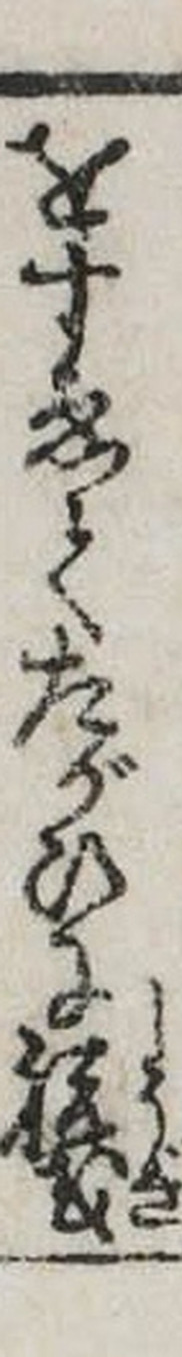をすゑてたがひに祝義
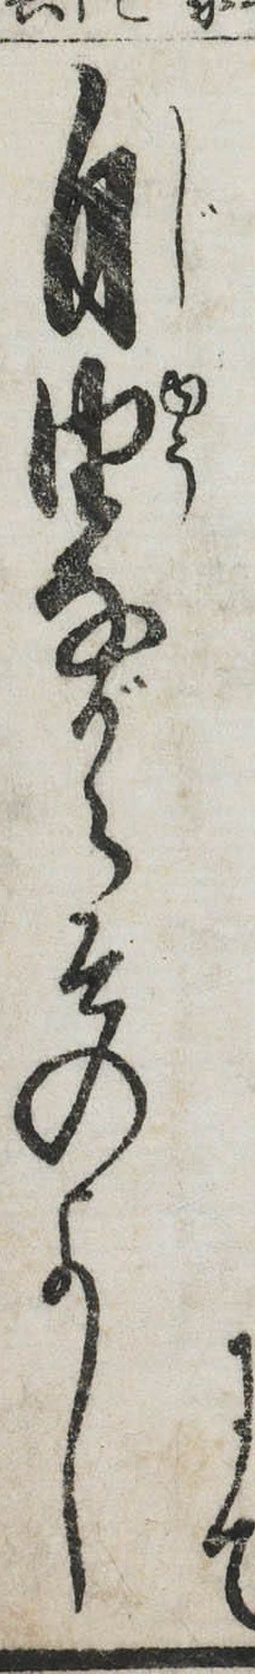自由ながらそのよし
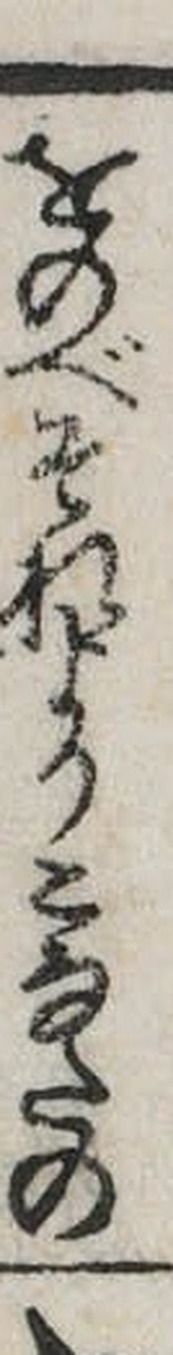をのべそれよりこなたの
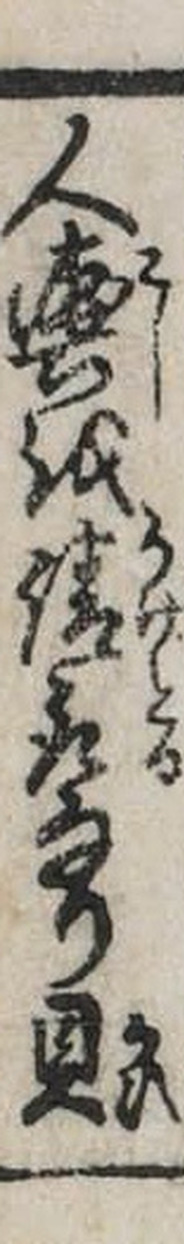人輿を請取なり貝

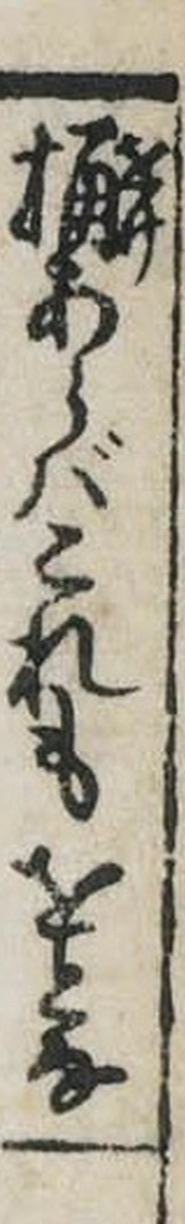桶あらばこれもをとな
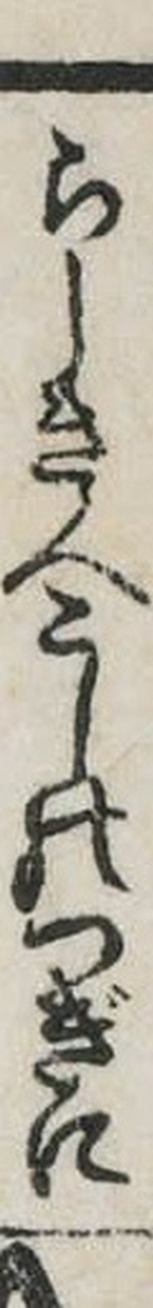らしき人こしのつぎに
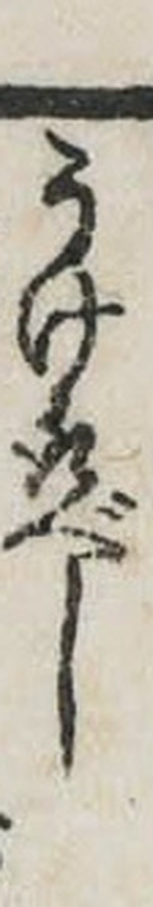うけ取べし
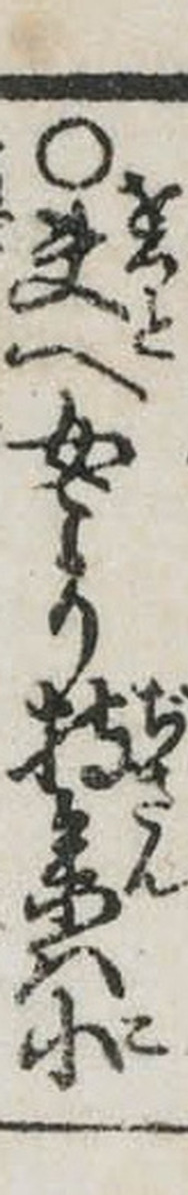○夫へ女より持参は小
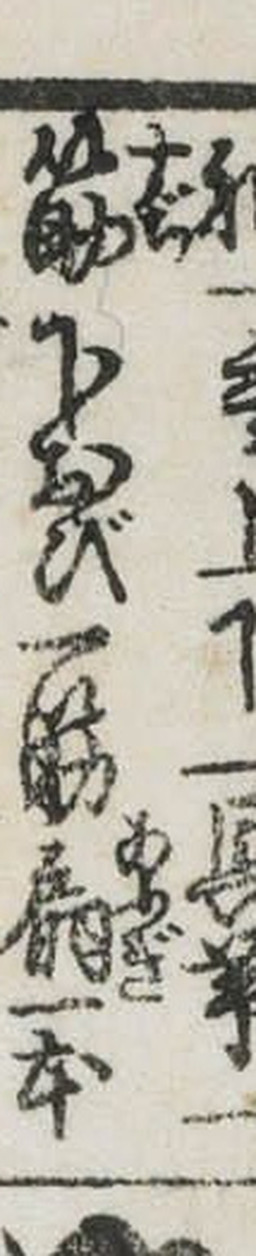筋下おび一筋扇一本
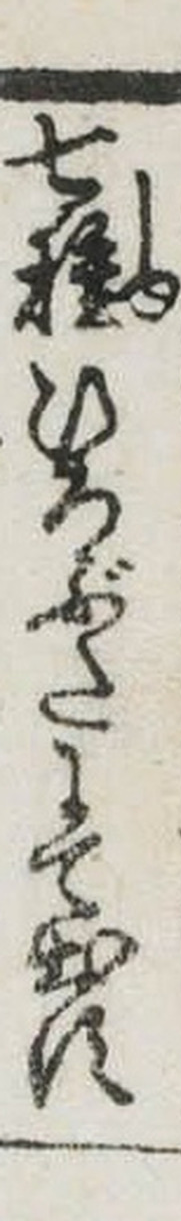七種ひろぶたにて出す
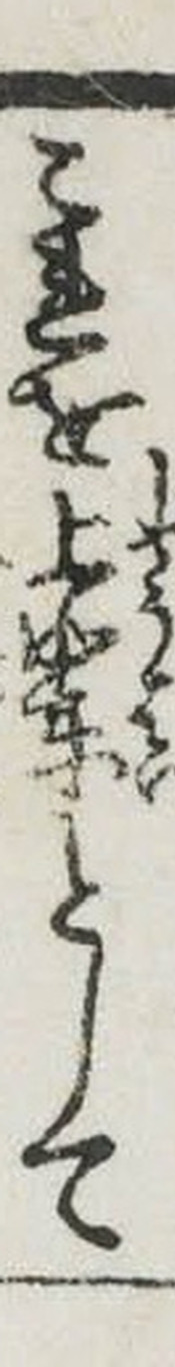これを上輩として
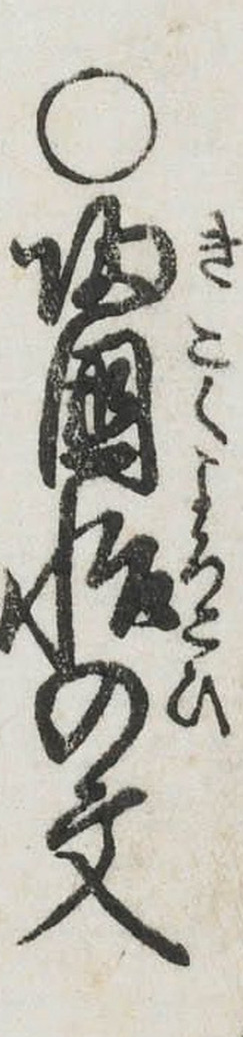○帰国怡の文
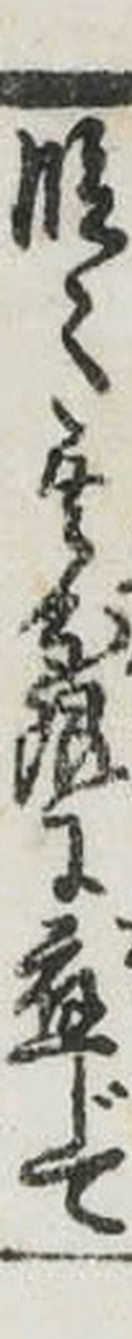段々其分限に応じて
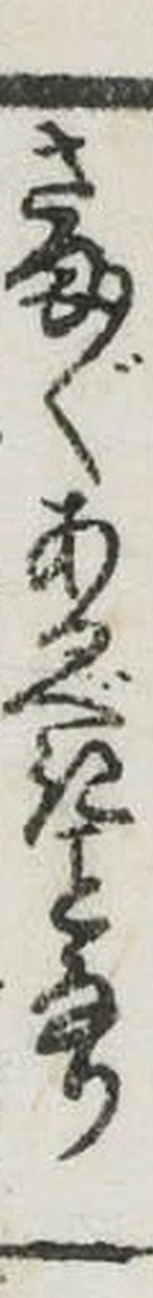さま〴〵あるべきとなり
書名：頭書萬用婦人手紙之文言
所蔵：東京学芸大学教育コンテンツアーカイブ
